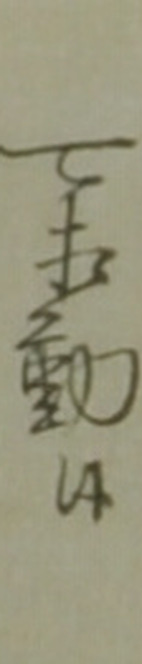可相勤候
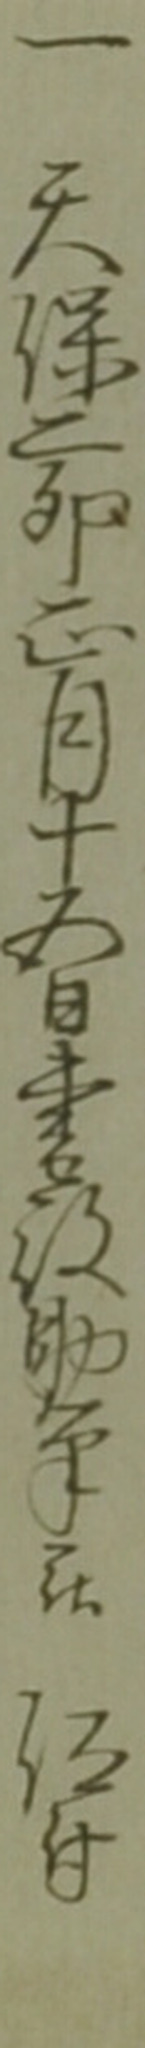一天保二卯正月十五日書役筆被仰付
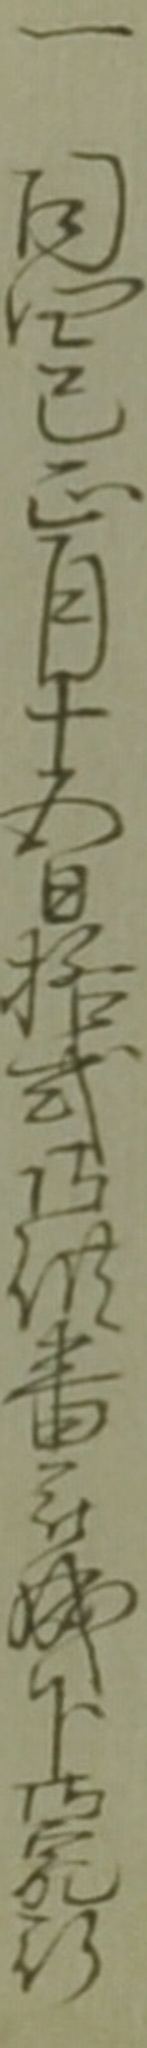一同四巳正月十五日格式御供番被成下御宛行
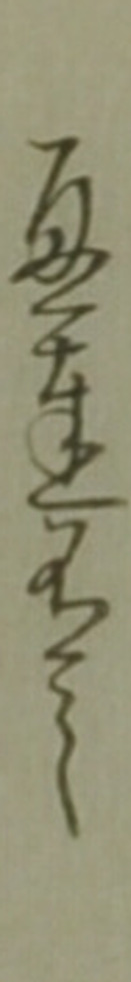通達有之
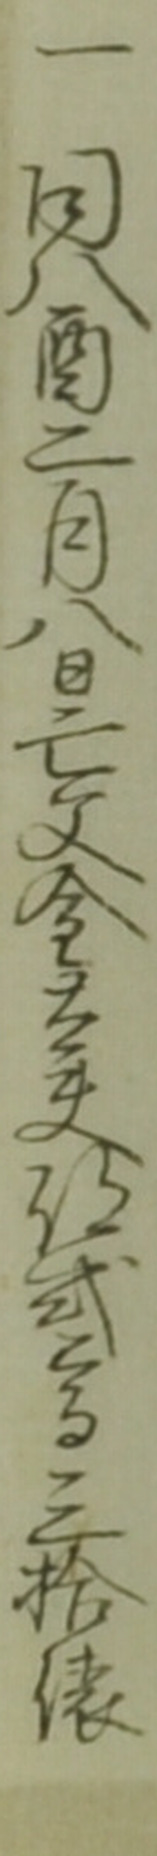一同八酉二月八日亡父金太夫跡式高三拾俵

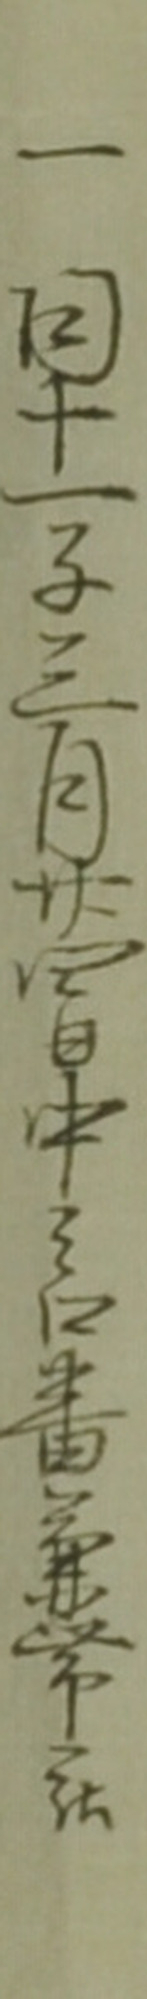一同十一子三月廿四日中之口番兼帯被
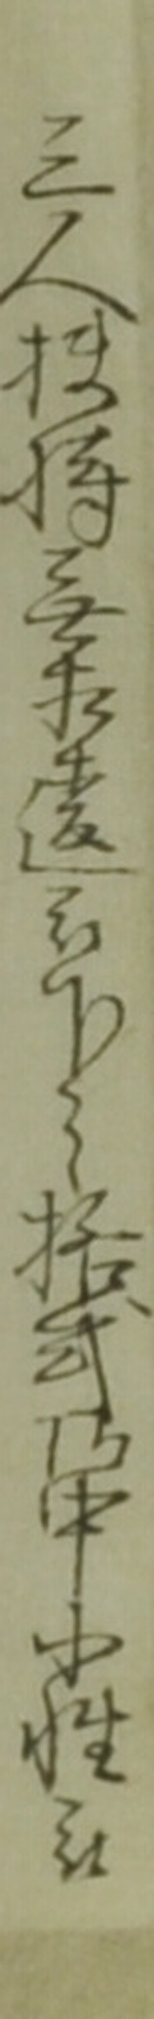三人扶持無相違被下之格式御中小性被
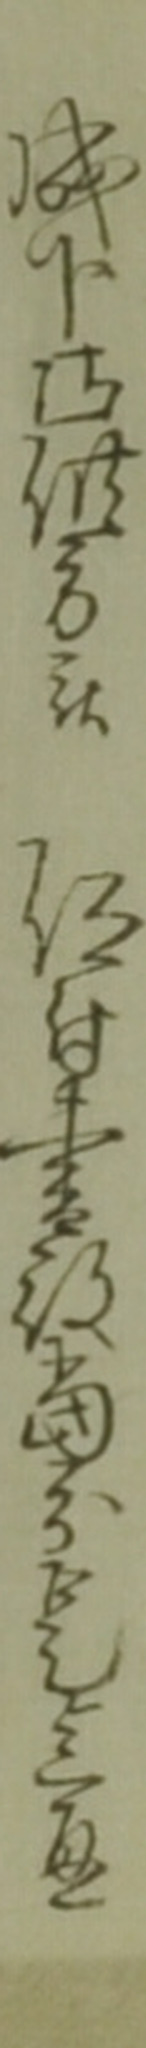成下御供方被仰付書役当分是迄之通
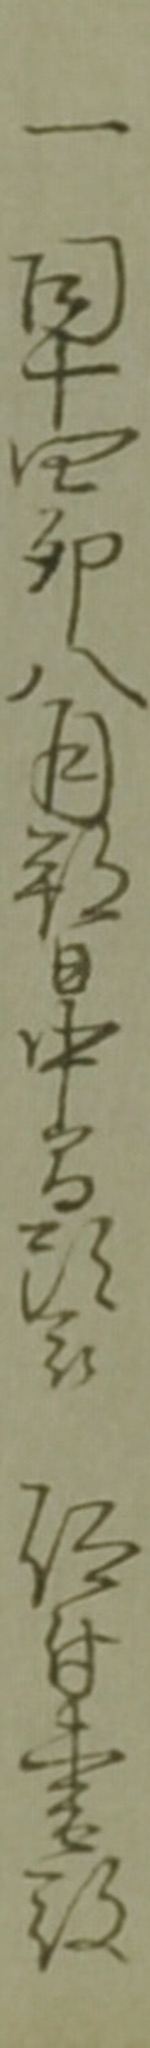一同十四卯八月朔日中間頭被仰付書役
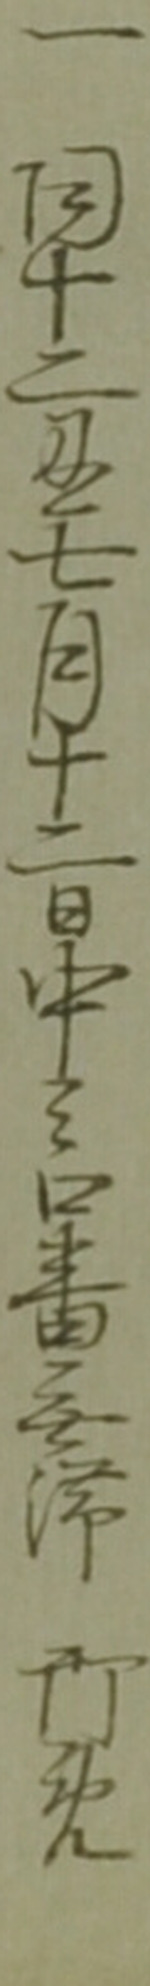一同十二丑七月十二日中之口番無滞御免
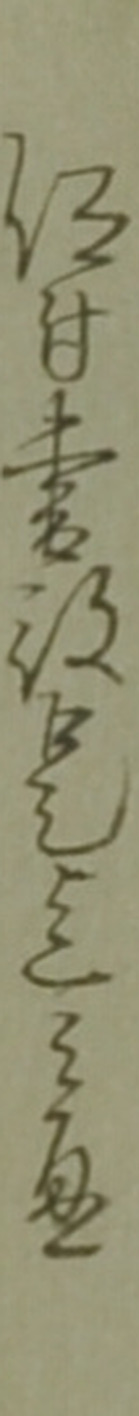仰付書役是迄之通
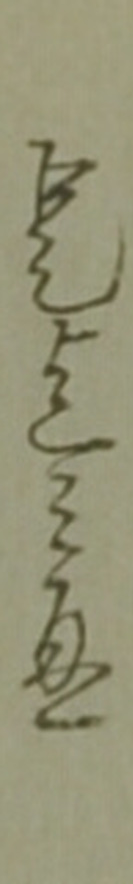是迄之通
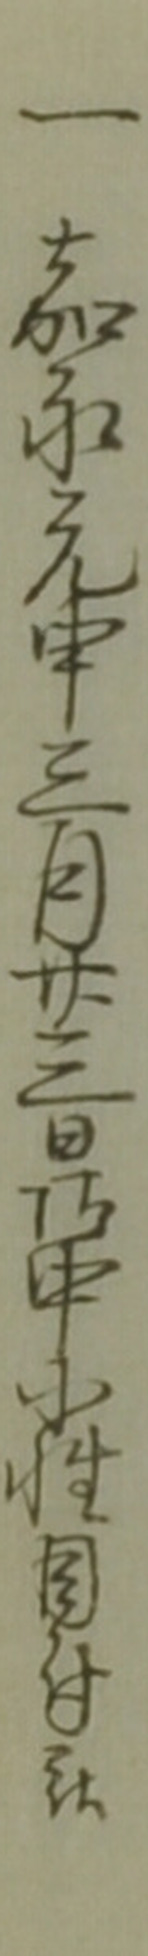一嘉永元申三月廿三日御中小性目付被
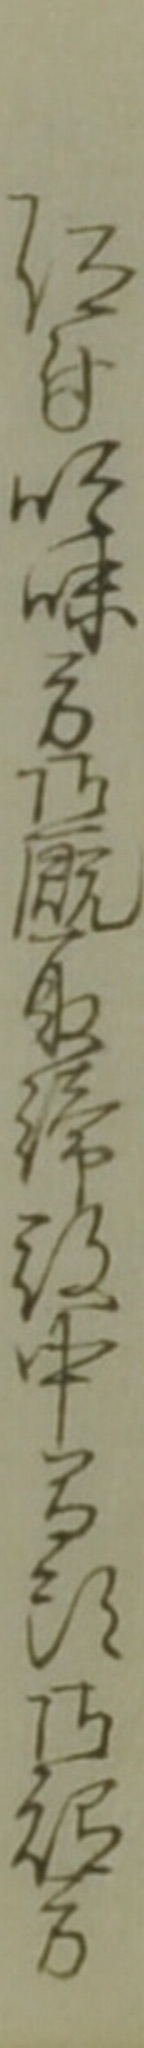仰付吟味方御厩取締中間頭御賄方
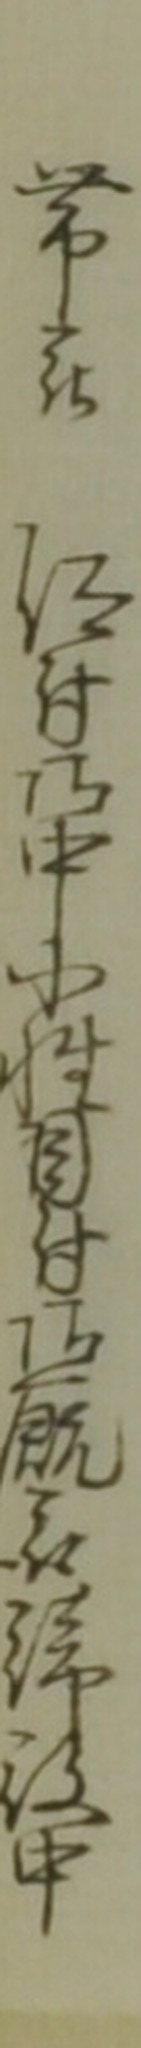帯被仰付御中小性目付御厩取締役中
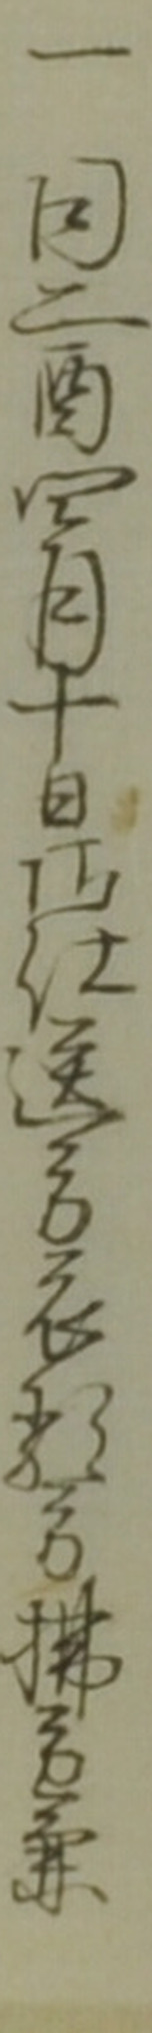一同二酉四月十日御仕送方衣類方払方兼
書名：無足諸士勤仕録（一）
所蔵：伊那市立高遠町図書館・合同会社AMANE
